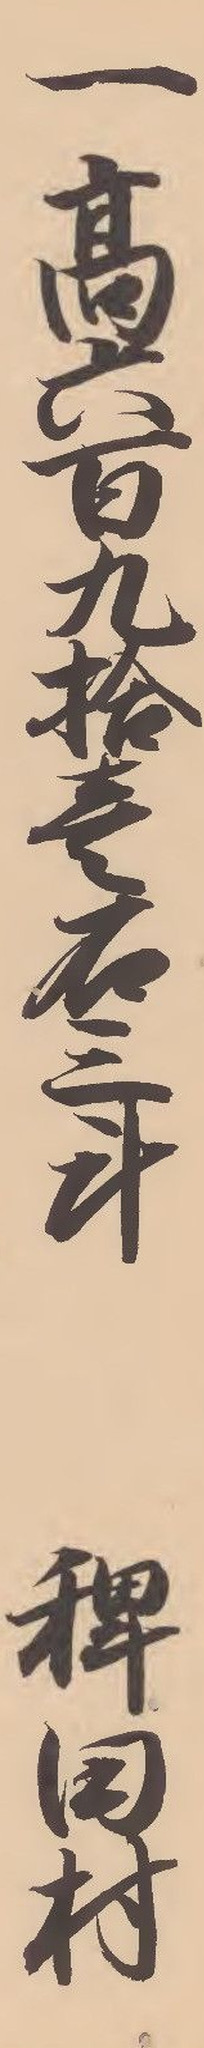一高六百九拾壱石三斗稗田村
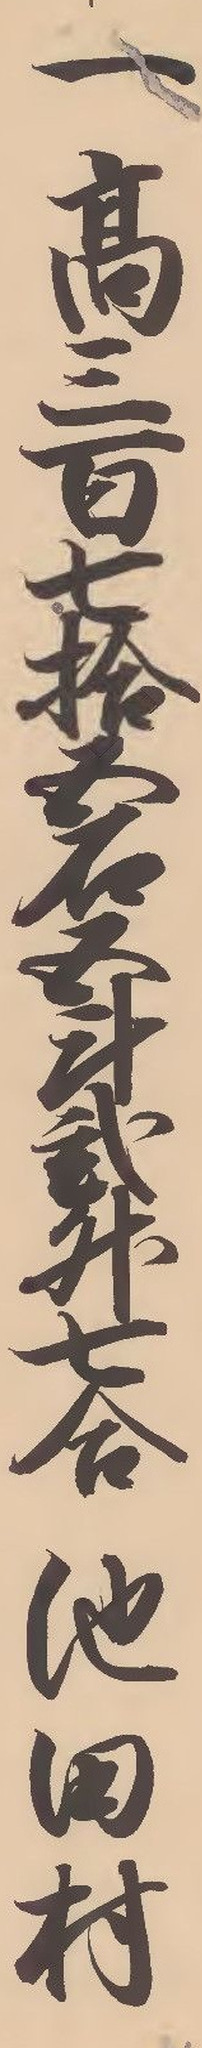一高三百七拾五石五斗弐升七合池田村
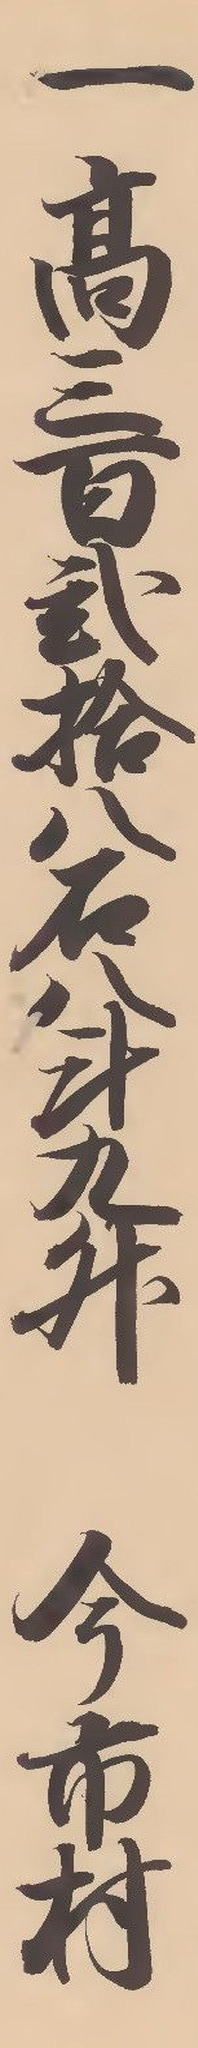一高三百弐拾八石八斗九升今市村
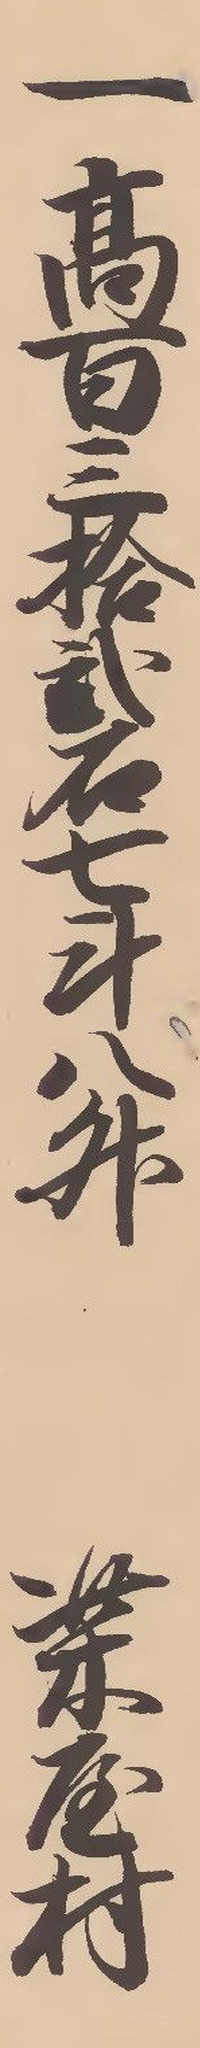一高百三拾弐石七斗八升柴屋村
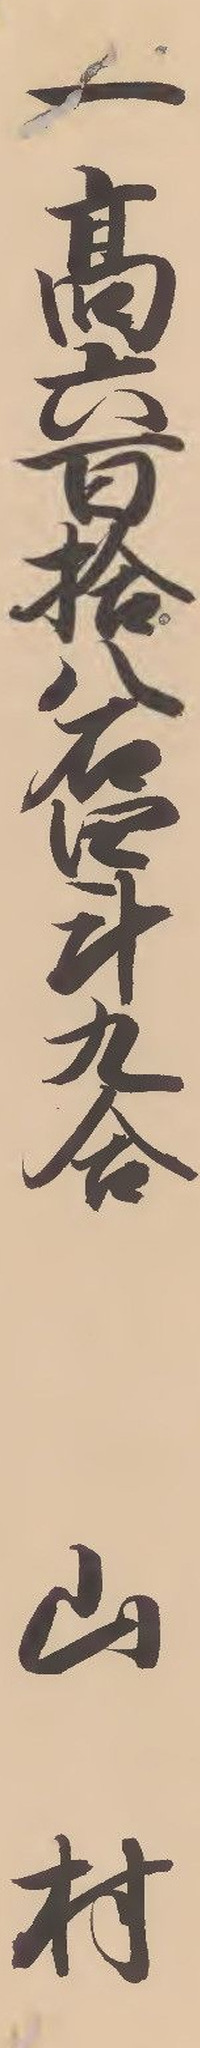一高六百拾八石四斗九合山村
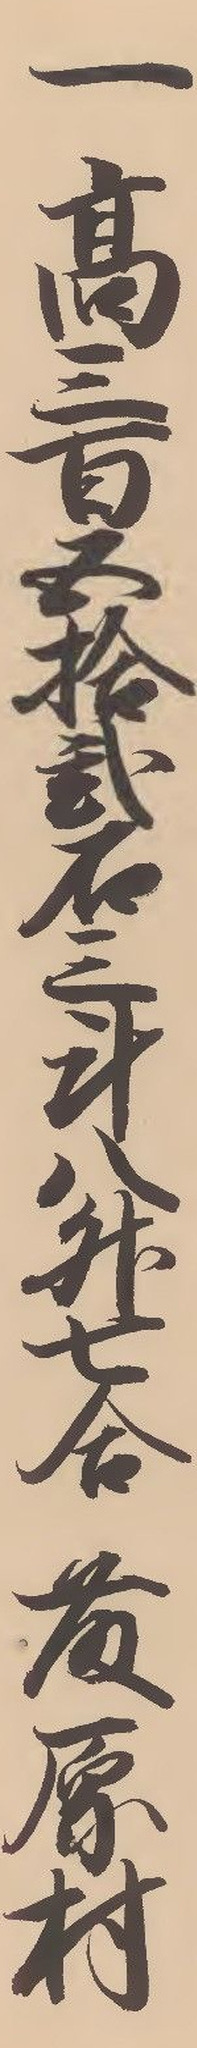一高三百五拾弐石三斗八升七合藤原村

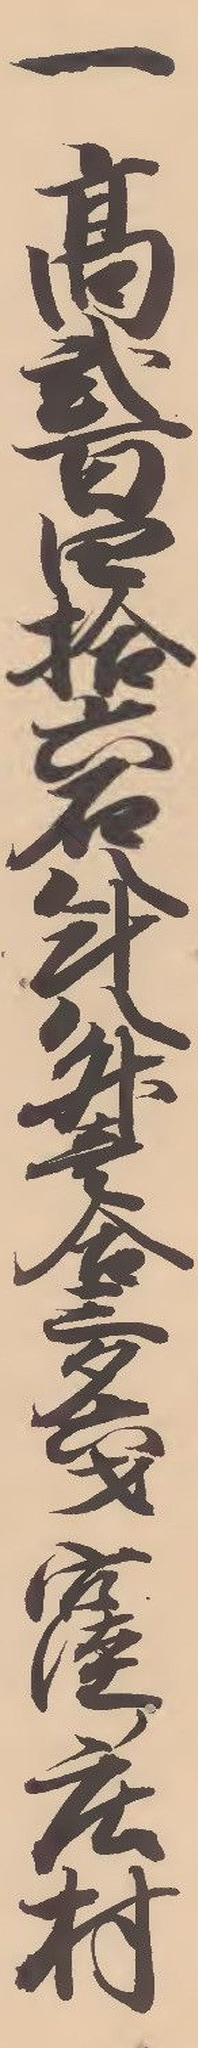一高弐百四拾六石八斗八升壱合三勺六才窪ノ庄村
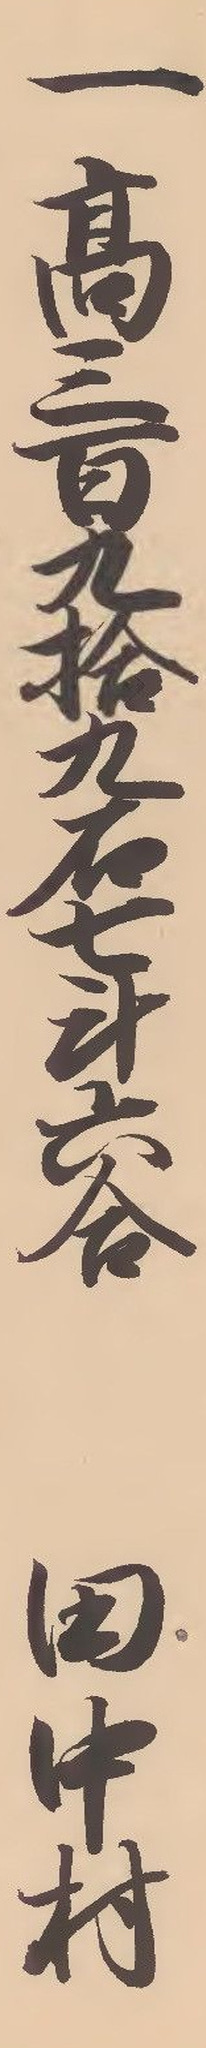一高三百九拾九石七斗六合田中村
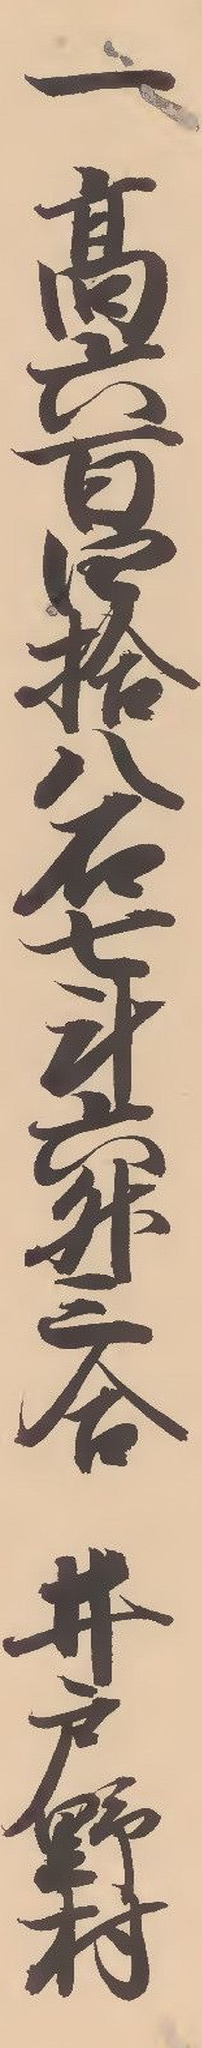一高六百四拾八石七斗六升三合井戸野村
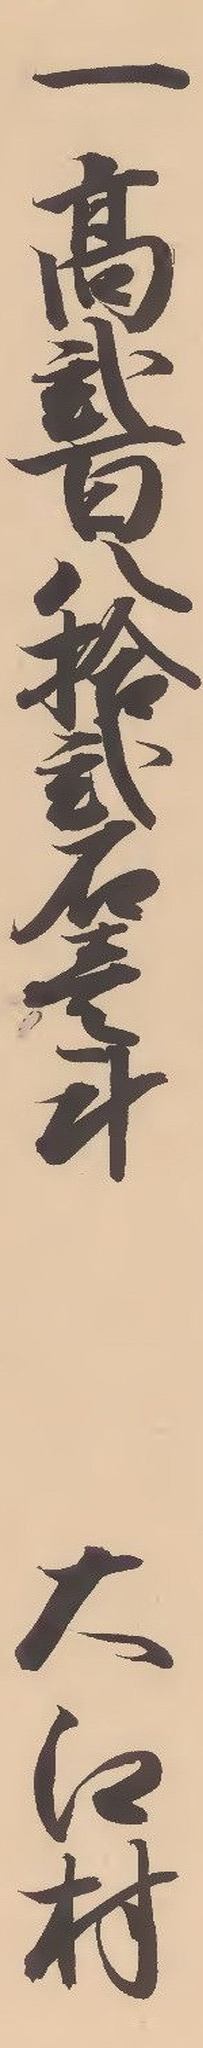一高弐百八拾弐石壱斗大江村
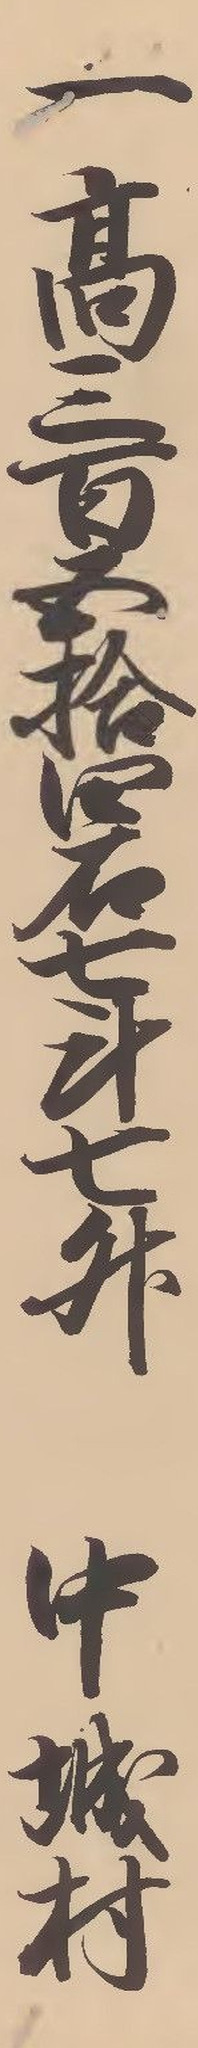一高三百五拾四石七斗七升中城村
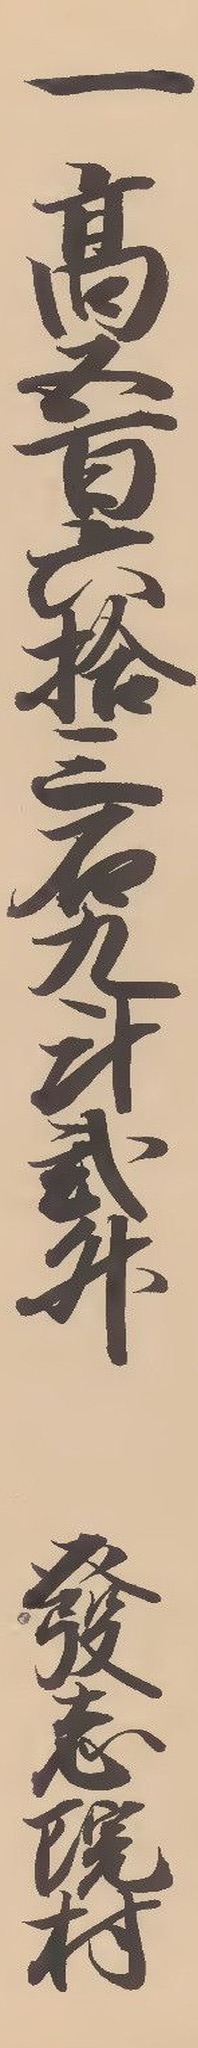一高五百六拾三石九斗弐升発志院村

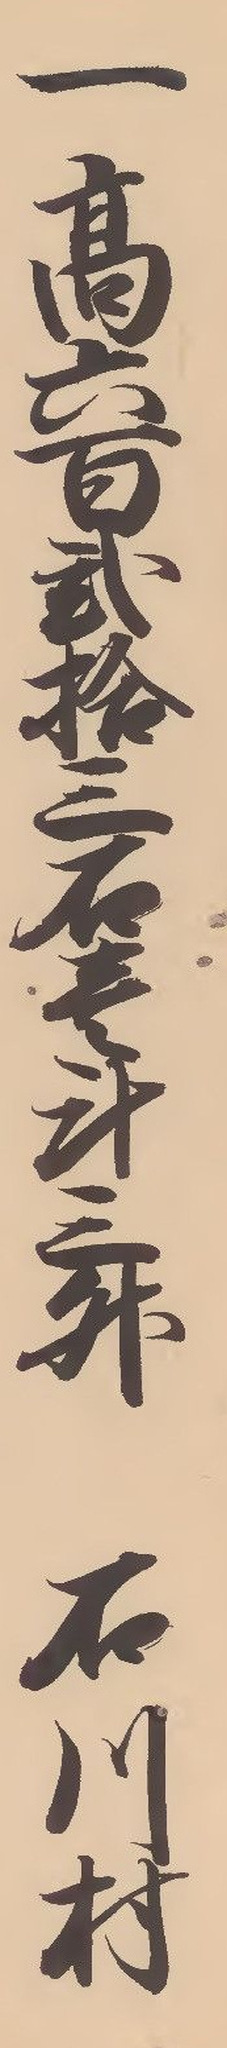一高六百弐拾三石壱斗三升石川村
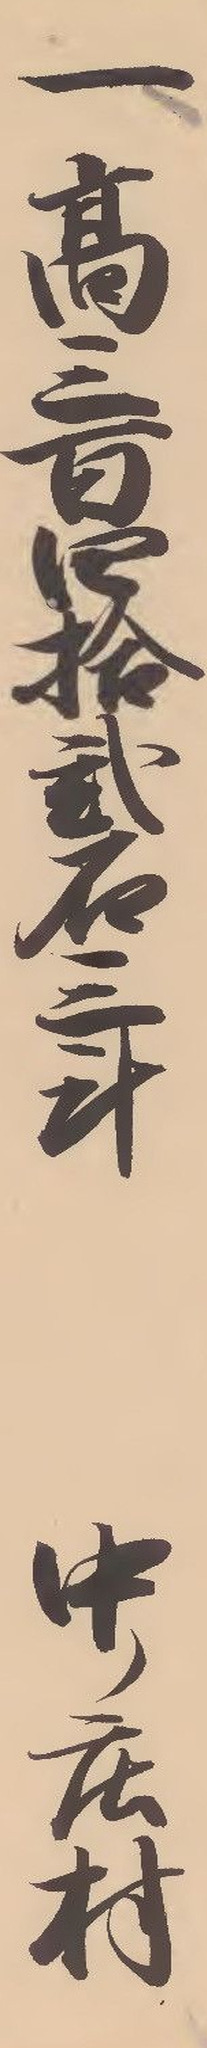一高三百四拾弐石三斗中ノ庄村
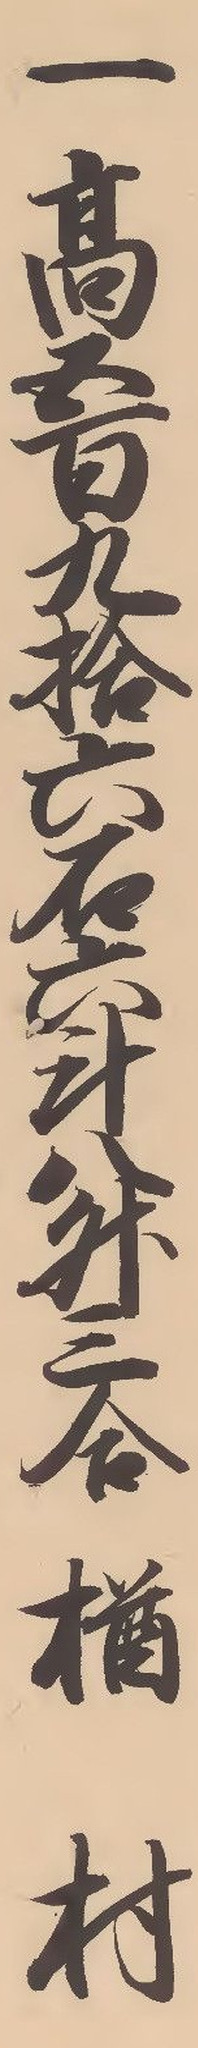一高五百九拾六石六斗八升三合楢村
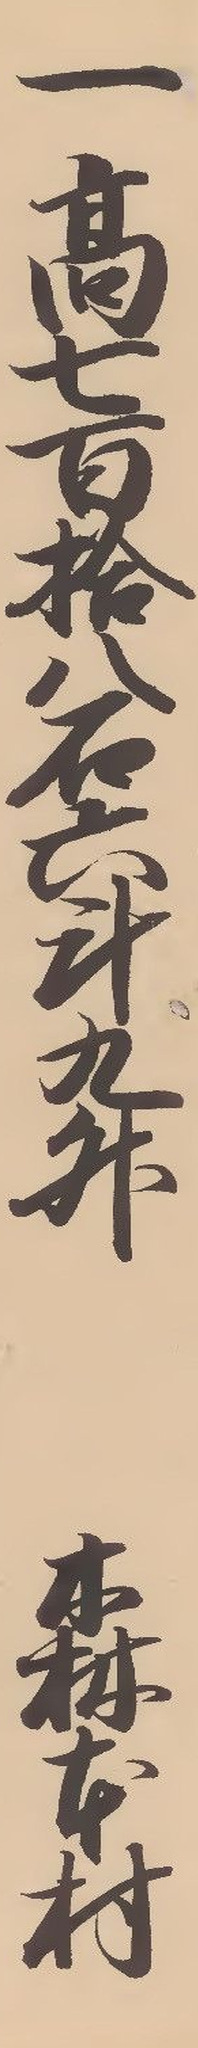一高七百拾八石六斗九升森本村
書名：大和国郷帳
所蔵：国立公文書館 National Archives of Japan
